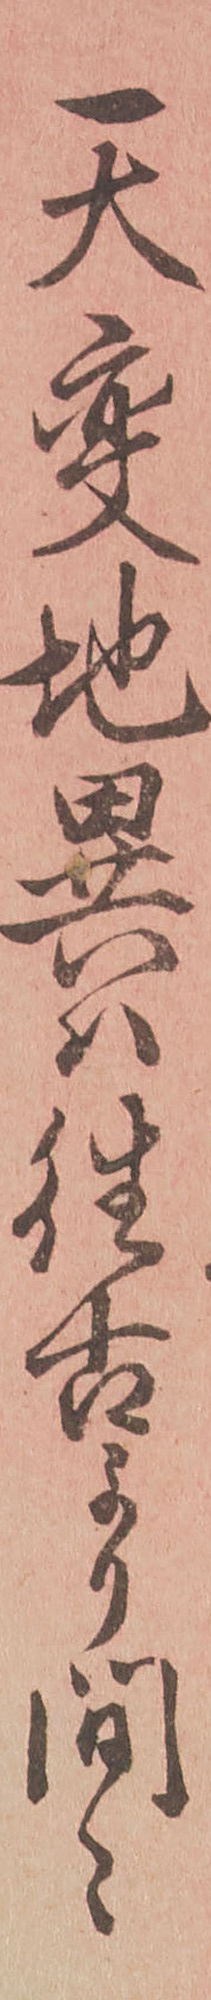天変地異は往古より間〃
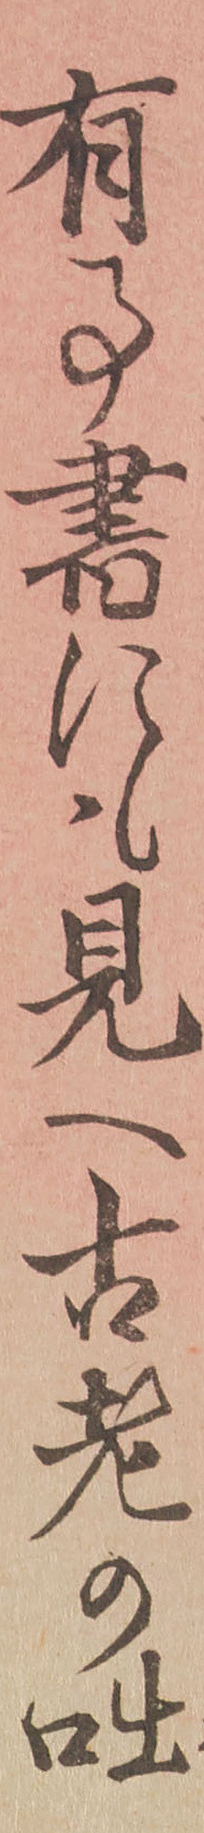有事書にも見へ古老の咄
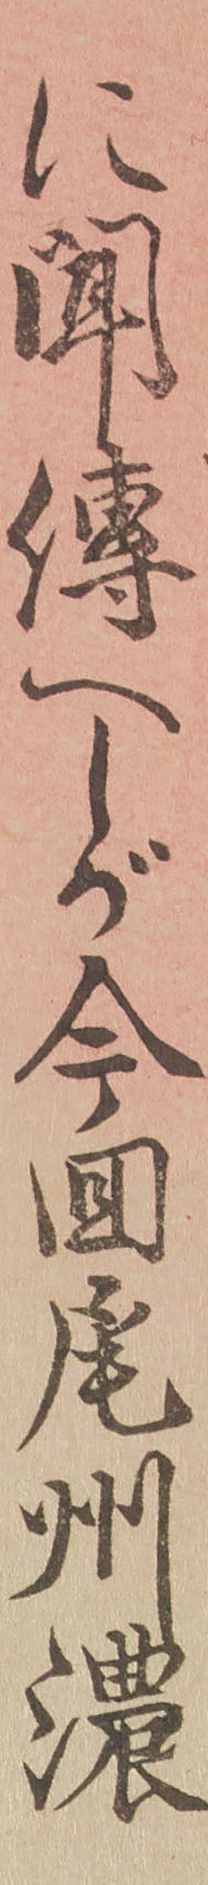に聞伝へしが今回尾州濃
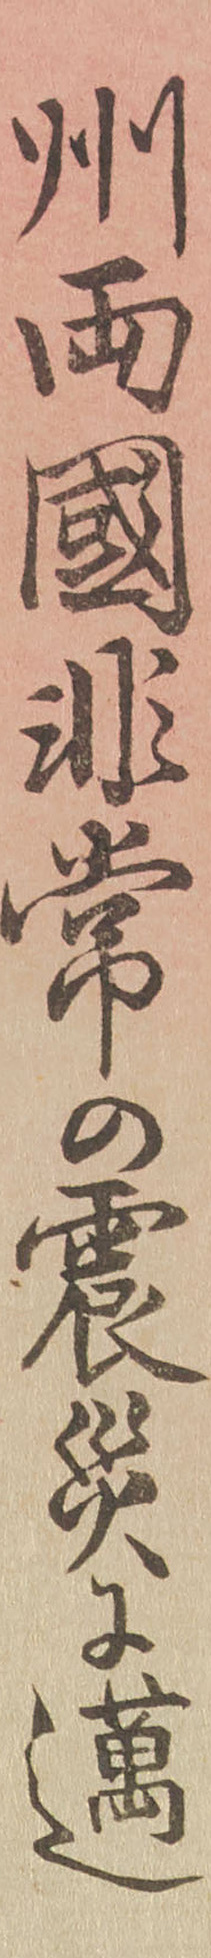州両国非常の震災に遭
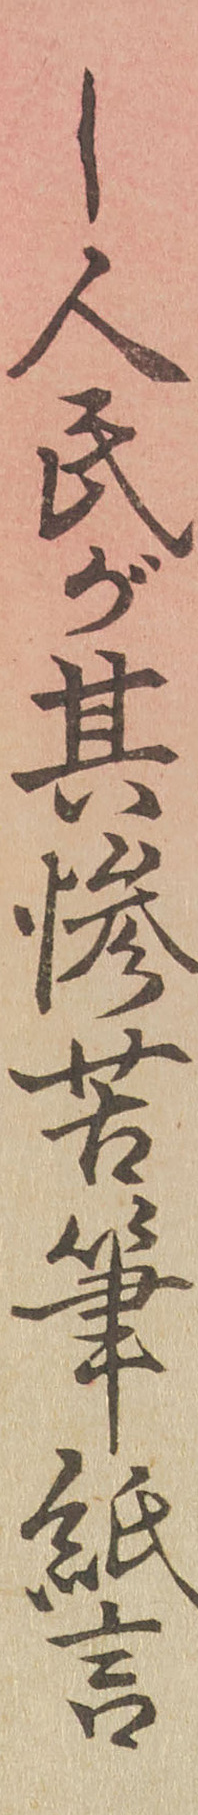し人民が其惨苦筆紙言
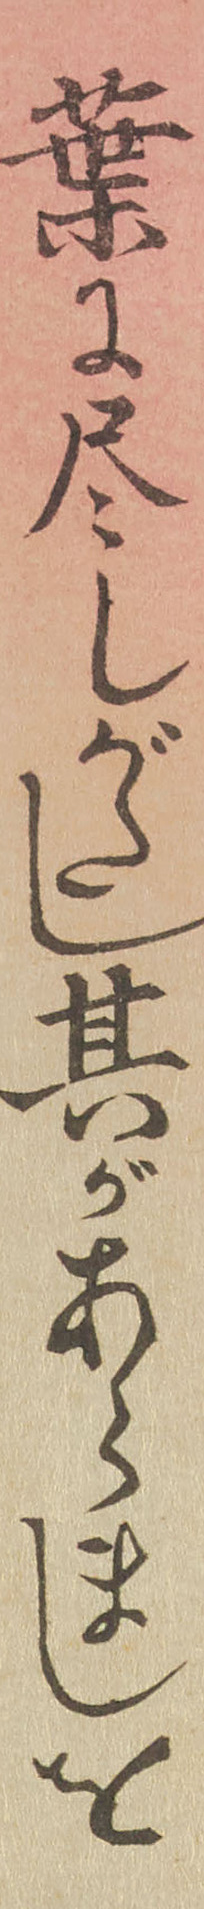葉に尽しがたし其があらましを
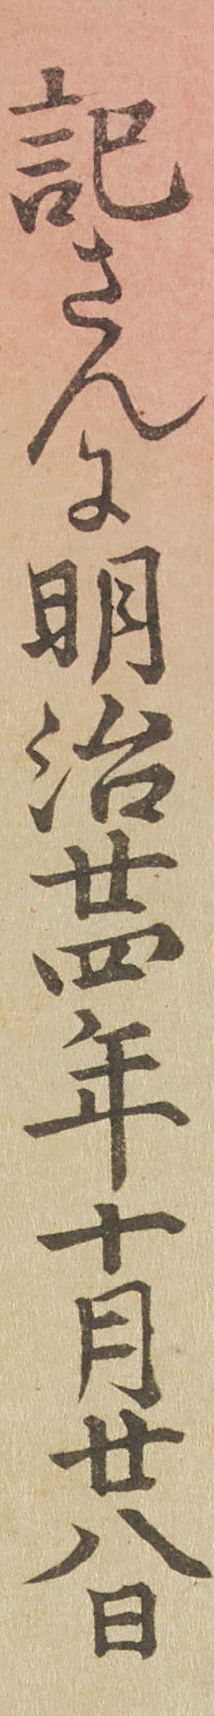記さんに明治廿四年十月廿八日
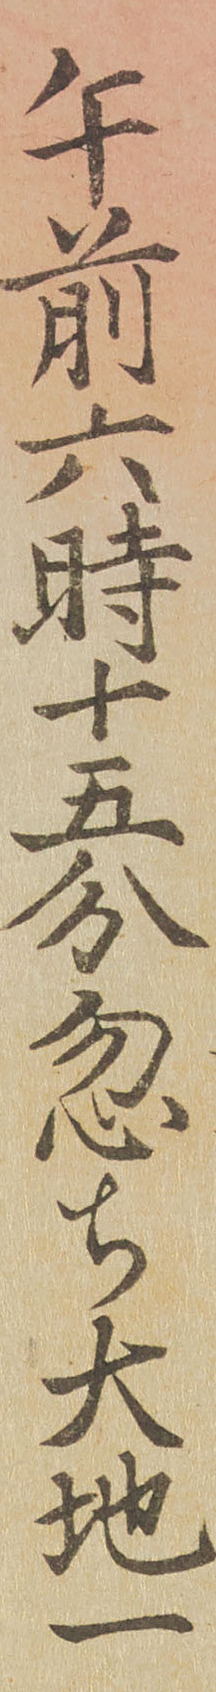午前六時十五分忽ち大地一
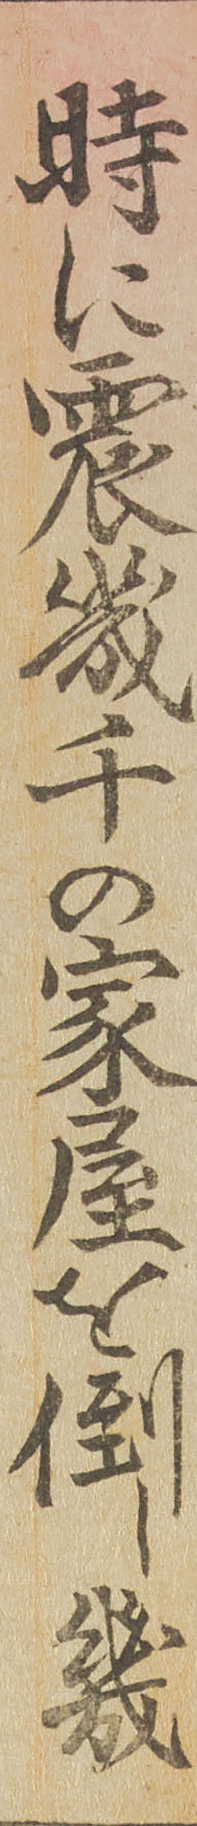時に震幾千の家屋を倒し往く幾

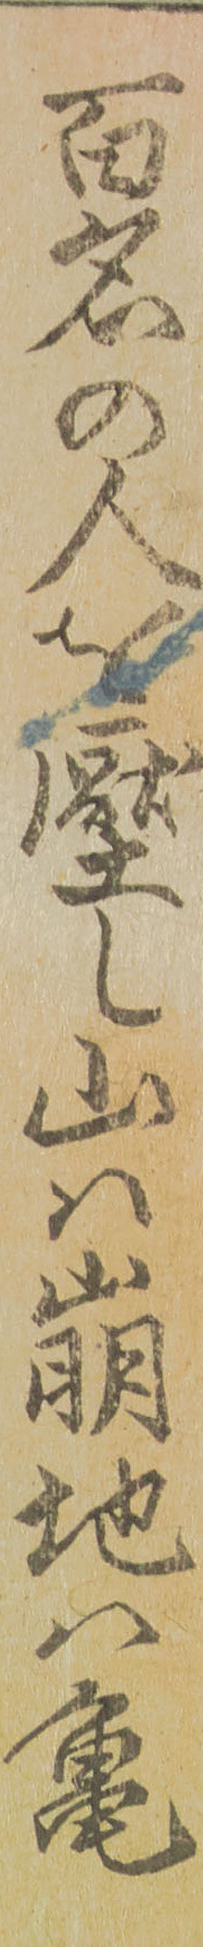百名の人を圧し山は崩地は亀
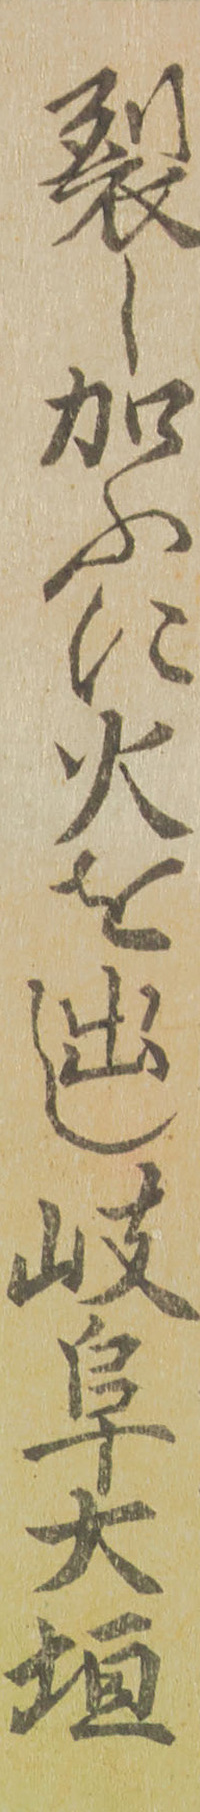裂し加ふに火を出し岐阜大垣
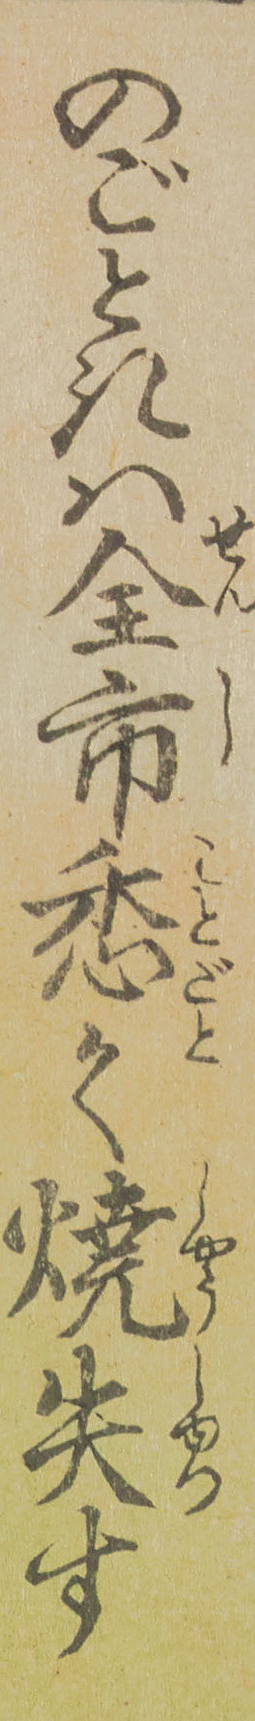のごときは全市悉く焼失す
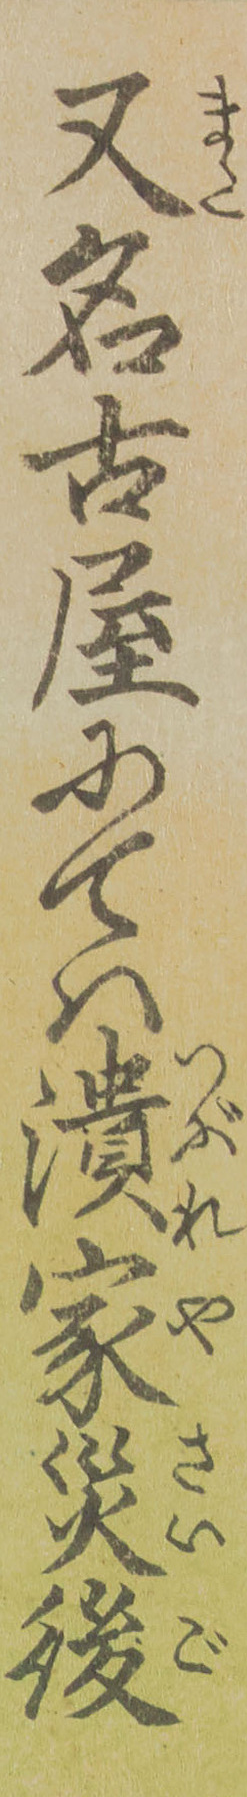又名古屋にては潰家災後
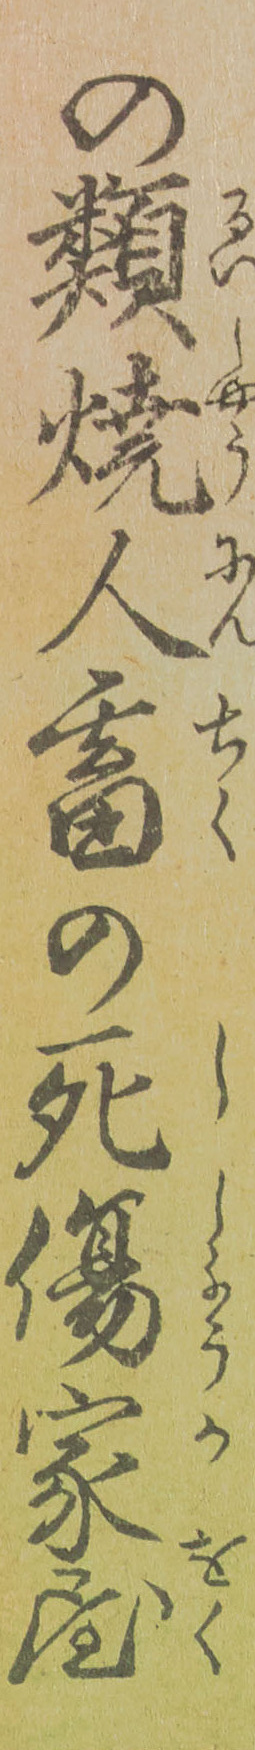の類焼人畜の死傷家屋
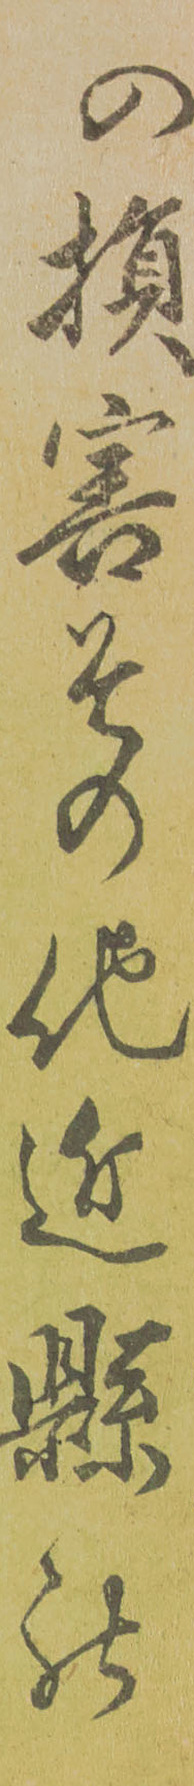の損害その他近県の
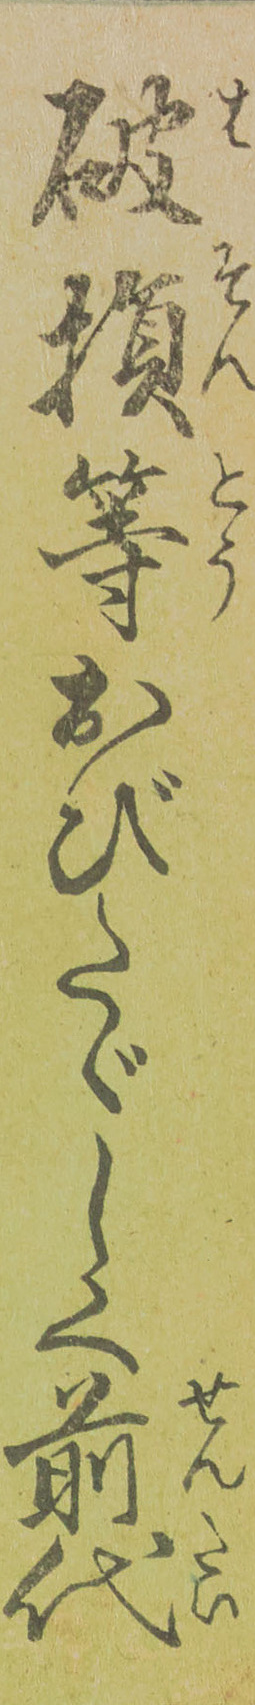破損等おびたゞしく前代
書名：岐阜県愛知県大地震実況
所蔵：東京大学総合図書館 General Library in the University of Tokyo, JAPAN
